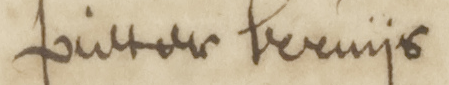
Pieter Kruijs
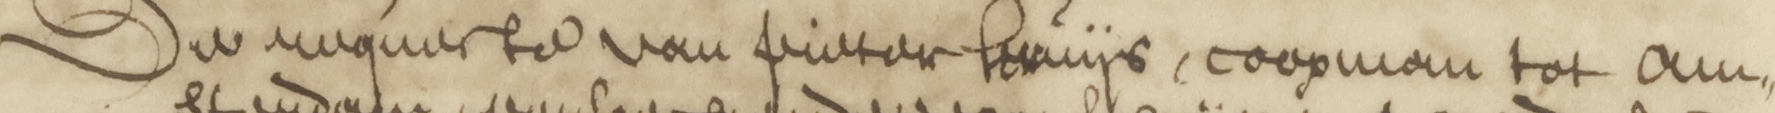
De requeste van Pieter Kruijs, coopman tot Am„
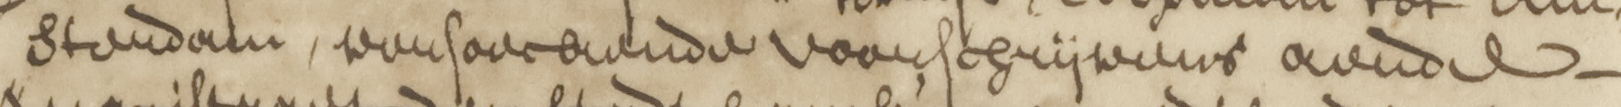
„sterdam, versoeckende voorschrijvens aende -
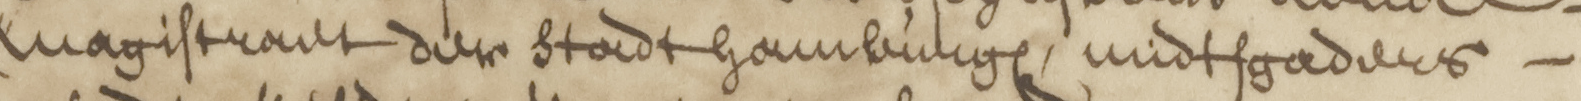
magistraet der stadt hamburgh, midtsgaders -
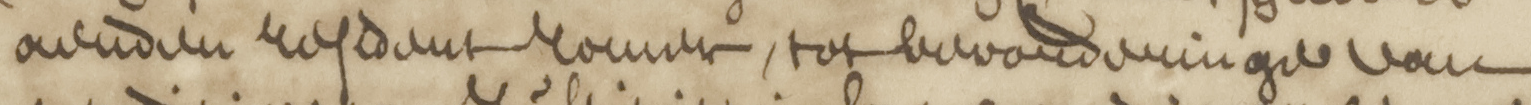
aenden resident romer, tot bevorderinge van
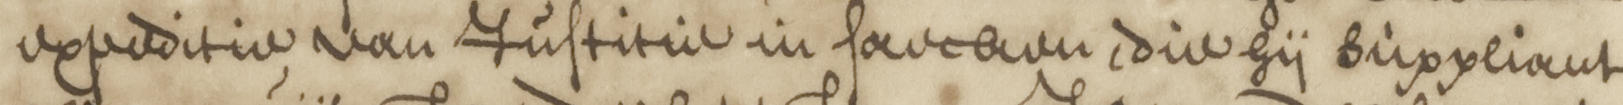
expeditie van Justitie in saecken, die hij Suppliant
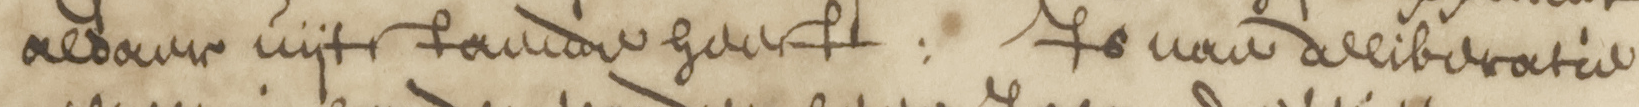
aldaer uijtstaende heeft: Is nae deliberatie
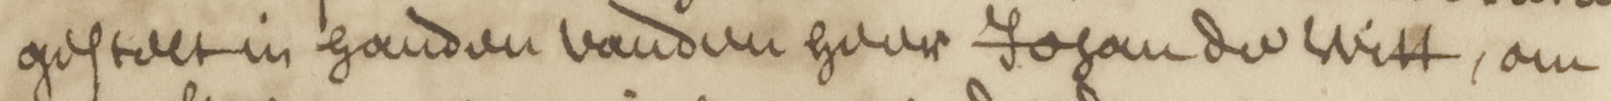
gestelt in handen vanden heer Johan de Witt, om
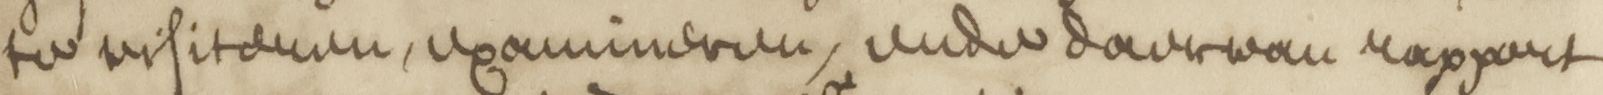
te visiteren, examineren, ende daervan rapport
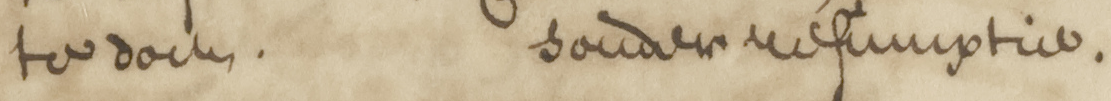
te doen. sonder resumptie.
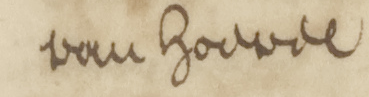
van hoevel
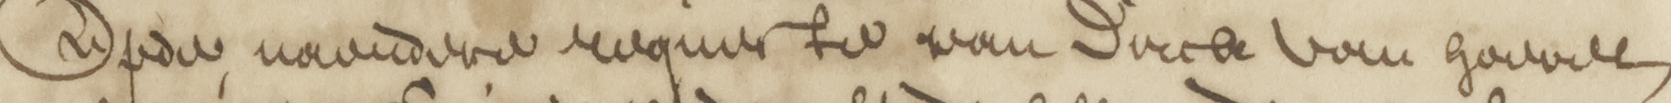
Opde naerdere requeste van Dirck van hoevel,
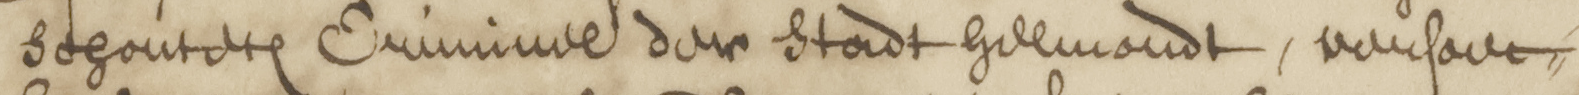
Schouteth Criminel der Stadt helmondt, versoec„
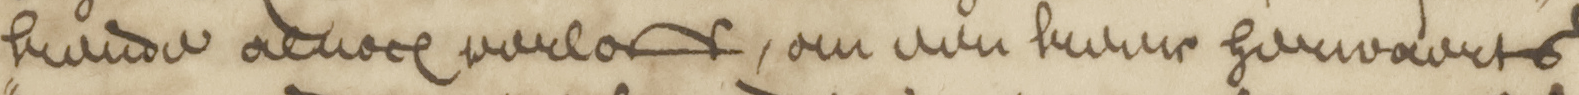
„kende alnoch verloff, om een keer herwaerts
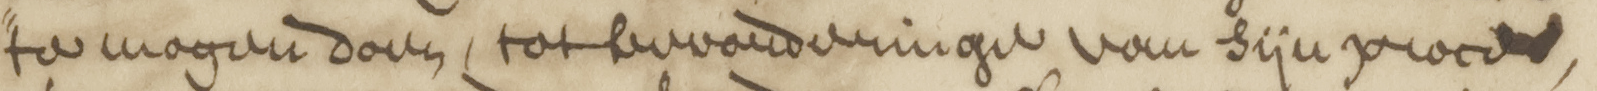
te mogen doen, tot bevorderinge van sijn proces,
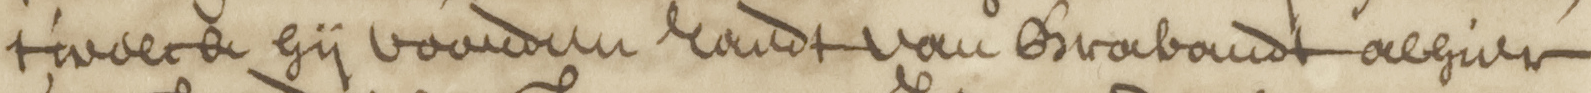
t'welck hij voorden Raedt van Brabandt alhier
